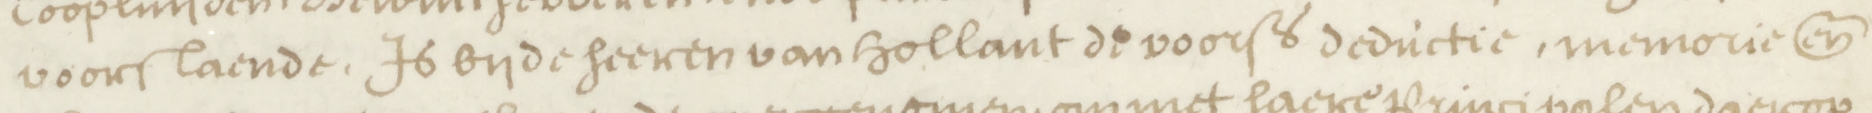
voorslaende. Is byde heeren van Hollant de voors deductie, memorie en
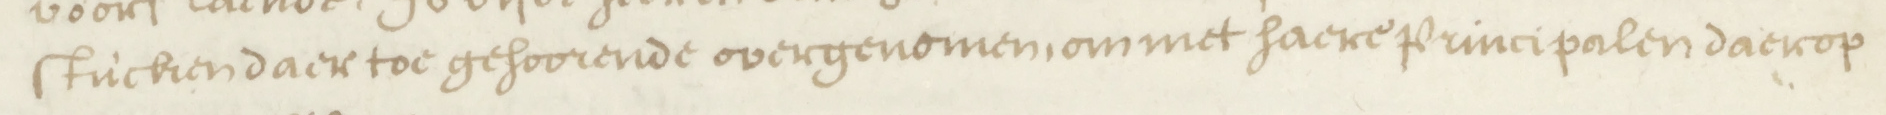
stucken daer toe gehoorende overgenomen, om met haere principalen daerop
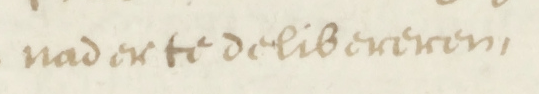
nader te delibereren,
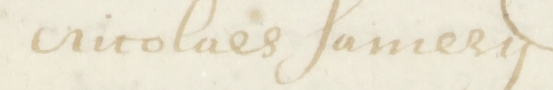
nicolaes Samery
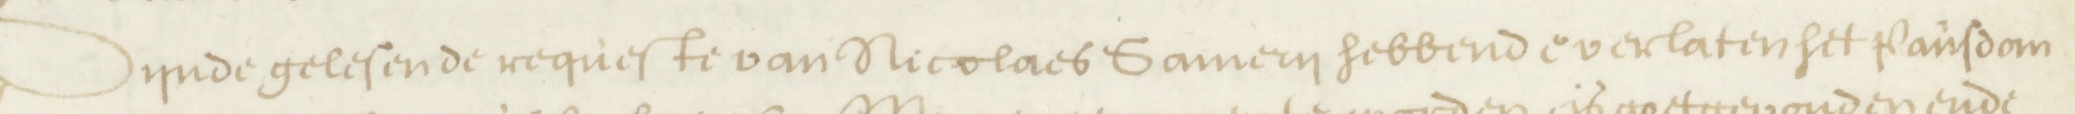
Synde gelesen de requeste van Nicolaes Samery hebbende verlaten het Pausdom
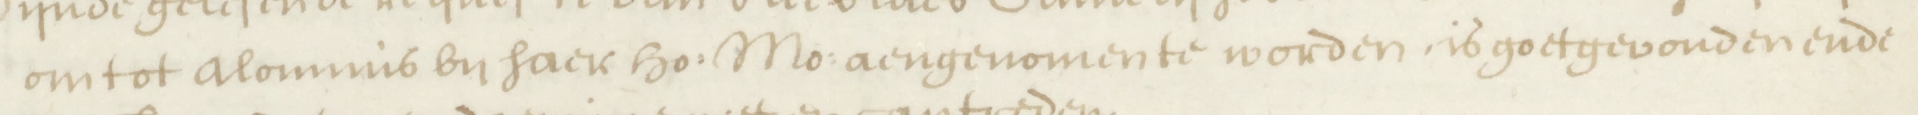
om tot Alomnus by haer Ho:Mo: aengenomen te worden, is goetgevonden ende
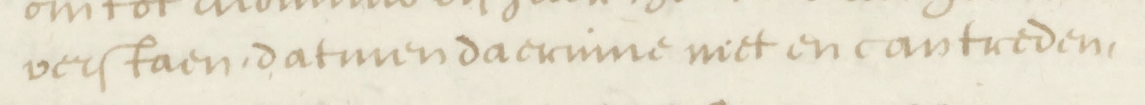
verstaen, datmen daerinne niet en can treden.
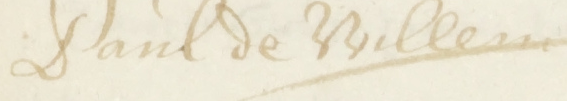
Paul de Willem
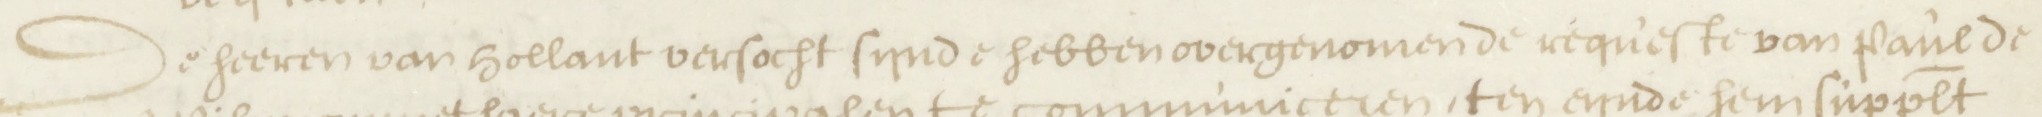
De heeren van Hollant versocht synde hebben overgenomen de requeste van Paul de
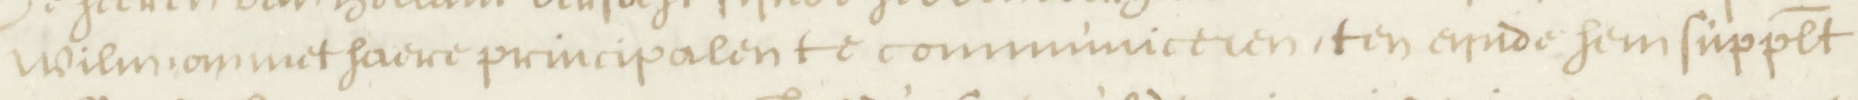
Wilm, om met haere principalen te communiceren, ten eynde hem supplt
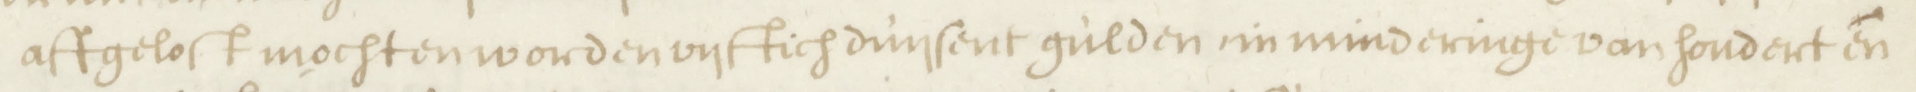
affgelost mochten worden vyftich duysent gulden, in minderinge van hondert en
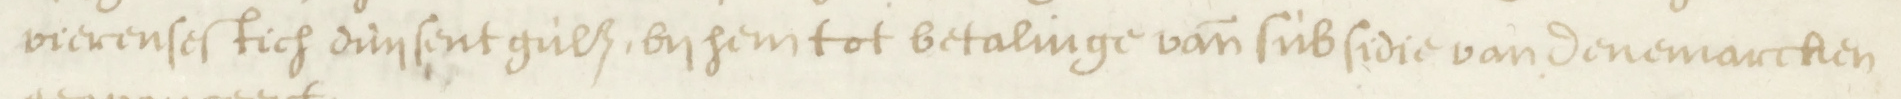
vierensestich duysent gul, by hem tot betalinge van subsidie van Denemarcken
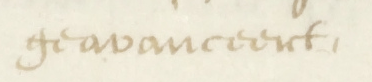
geavanceert.
